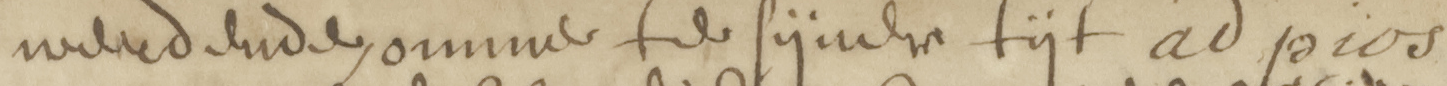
werdende, omme te sijnder tijt ad pios
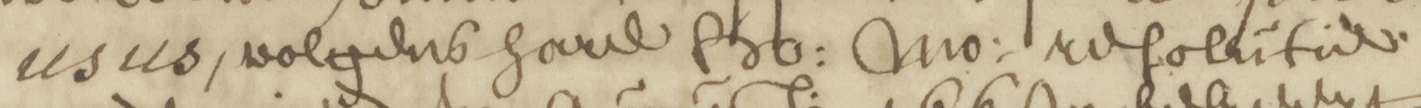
usus, volgens hare Ho:Mo: resolutie
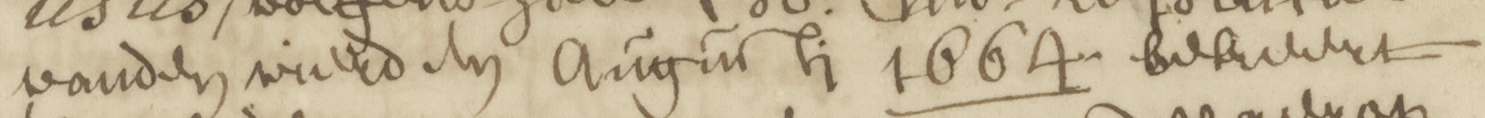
vanden vierden Augusti 1664 bekeert
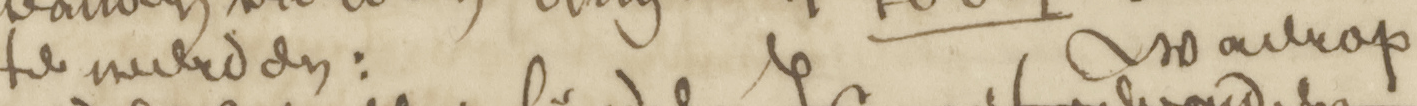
te werden: Waerop
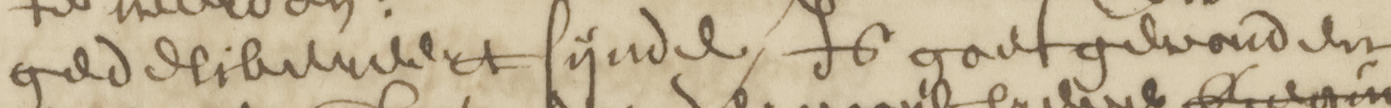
gedelibereert sijnde, Is goetgevonden
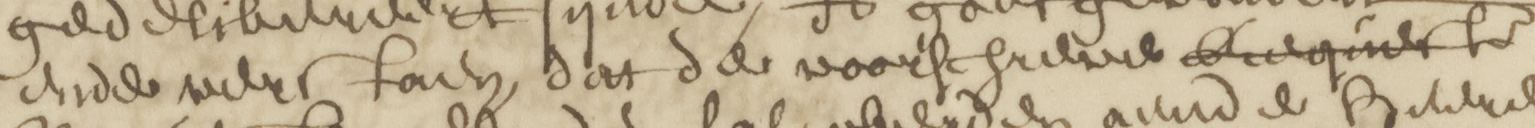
ende verstaen, dat de voorschreve Requeste
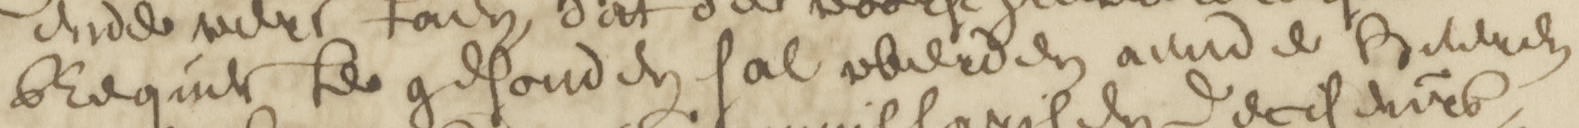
Requeste gehouden sal werden aende Heeren
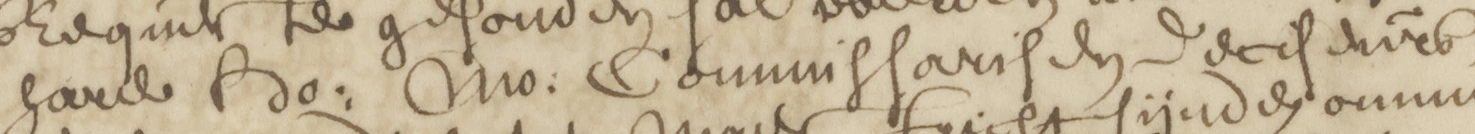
hare Ho:Mo: Commissarisen Deciseurs,
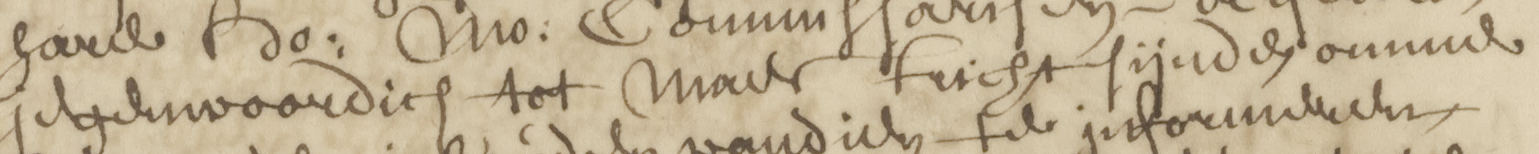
jegenwoordich tot Maestricht sijnde, omme
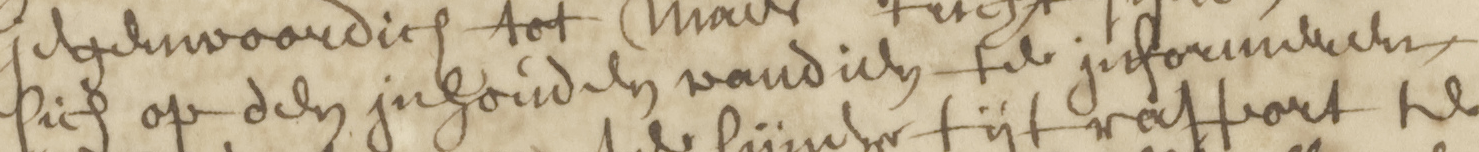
sich op den inhouden vandien te informeren,
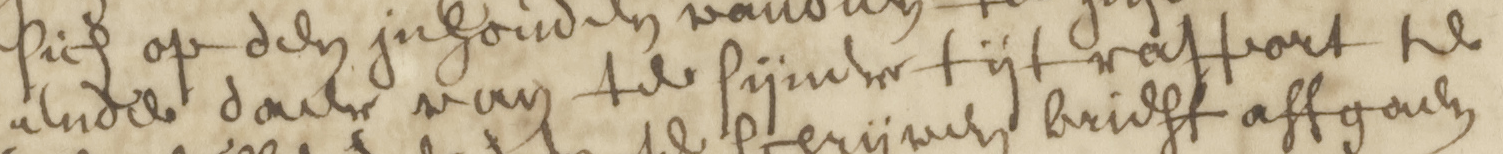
ende daer van te sijner tijt rapport te
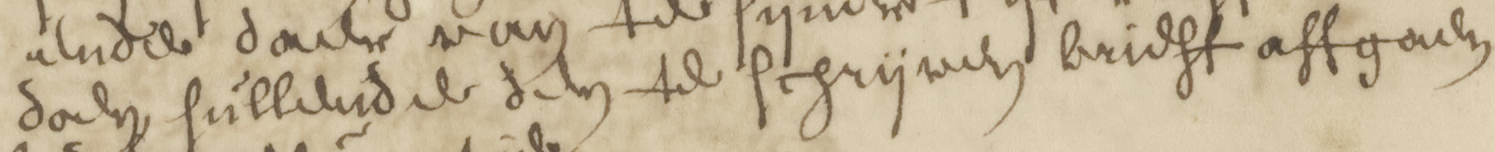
doen, sullende den te schrijven brieff affgaen
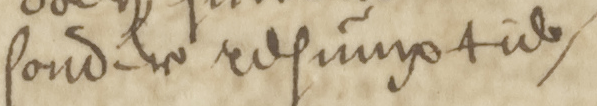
sonder resumptie.
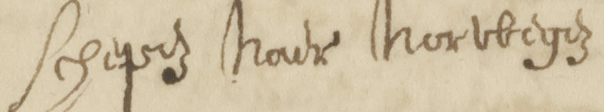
schepen naer Norwegen
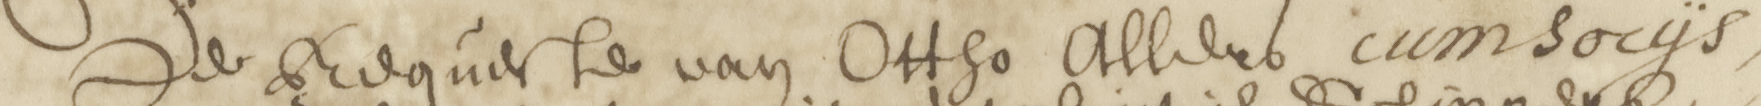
De Requeste van Ottho Allers cum socijs,
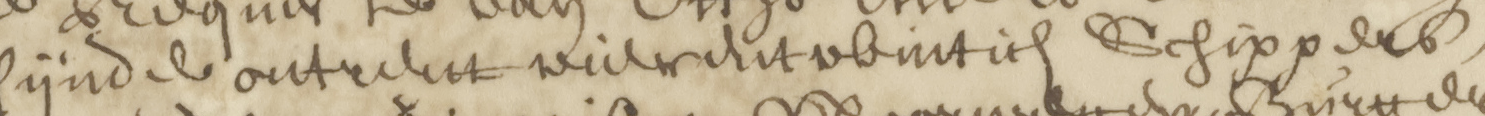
sijnde ontrent vierentwintich Schippers,
